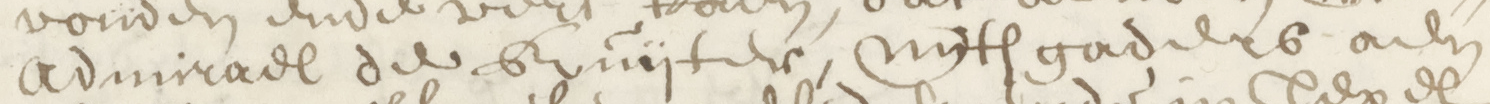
Admirael de Ruijter, mitsgaders aen
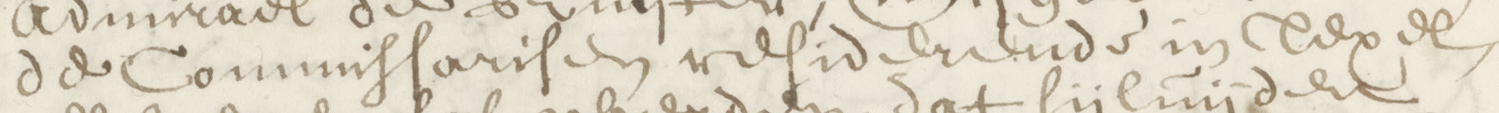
de Commissarisen residerende in Texel
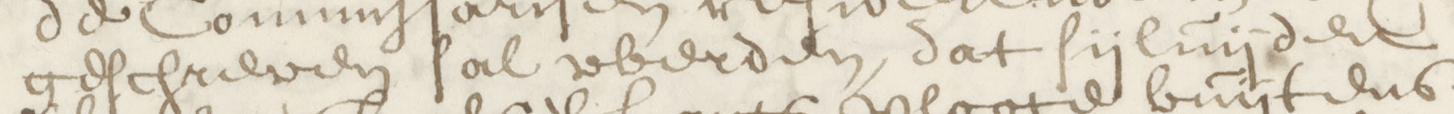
geschreven sal werden, dat sijluijden
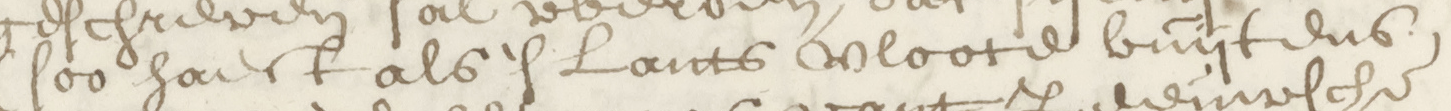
(soo haest als 's Lants Vloote buijtens,
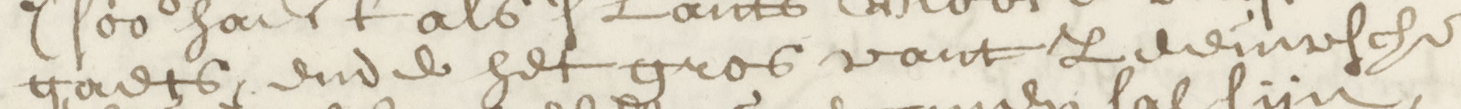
gaets, ende het gros vant Zeeuwsche
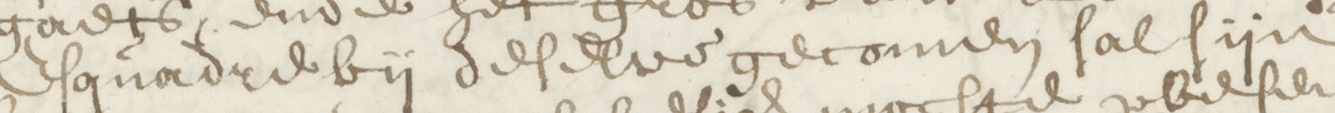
Esquadre bij deselve gecomen sal sijn,
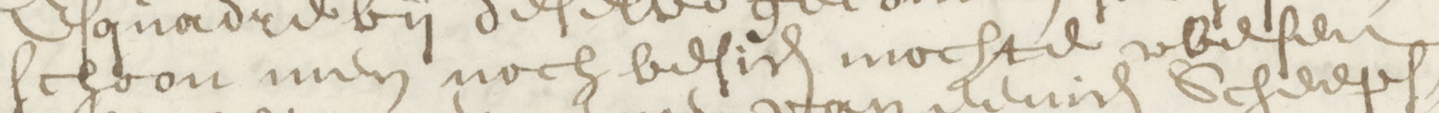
schoon men noch besich mochte wesen
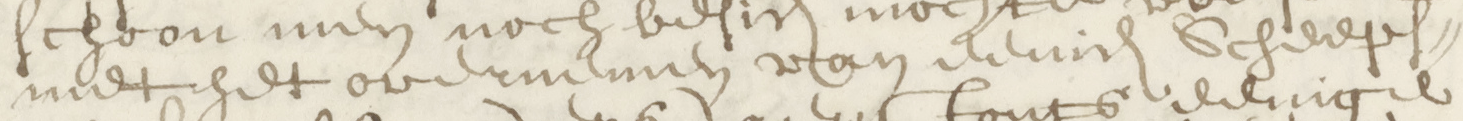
met het overnemen van eenich Scheeps„
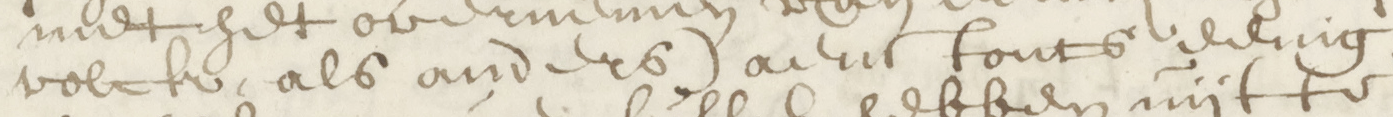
volck, als anders) aenstonts eenige
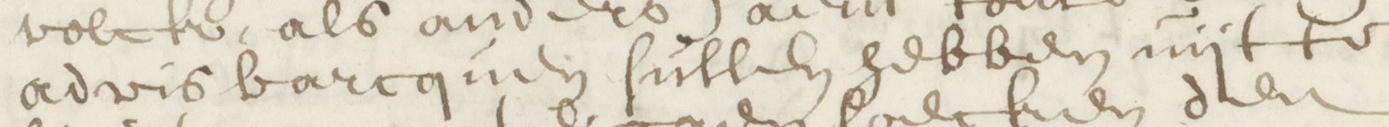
advis barcquen sullen hebben uijt te
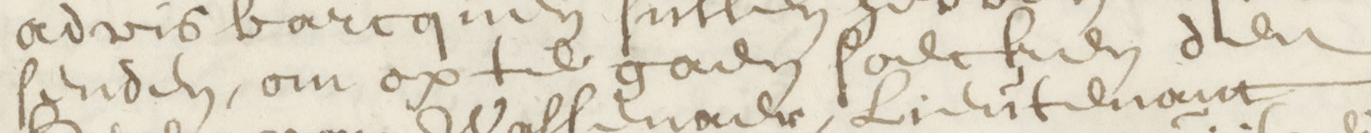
senden, om op te gaen soecken den
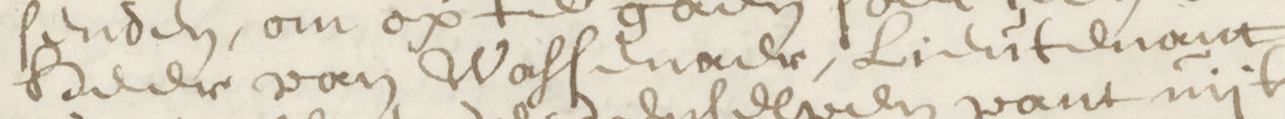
Heer van Wassenaer, Lieutenant
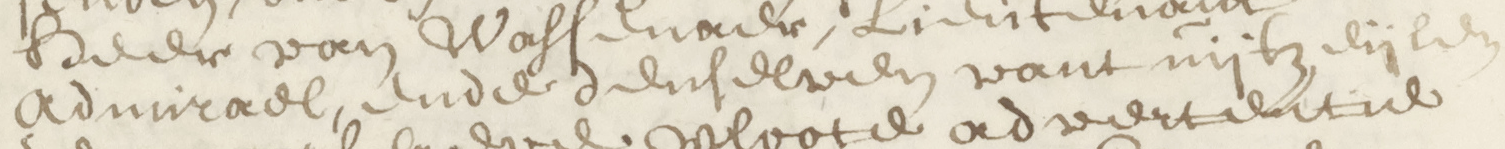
Admirael, ende denselven vant uijtzeijlen
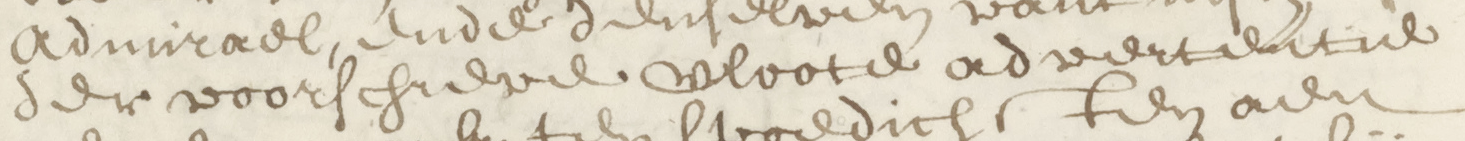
der voorschreve vloote advertentie
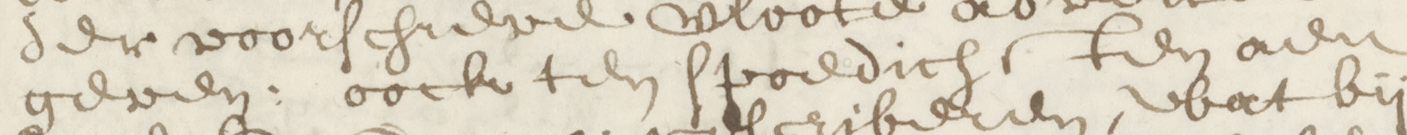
geven: oock ten spoedichsten aen
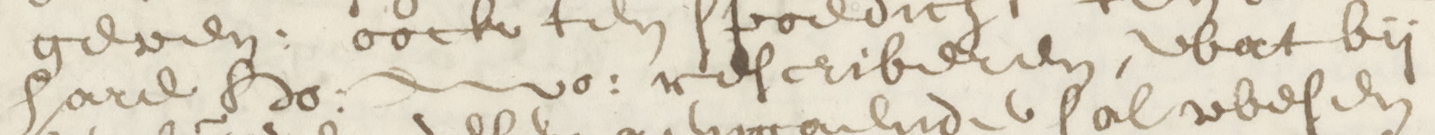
hare Ho:Mo: rescriberen, wat bij
